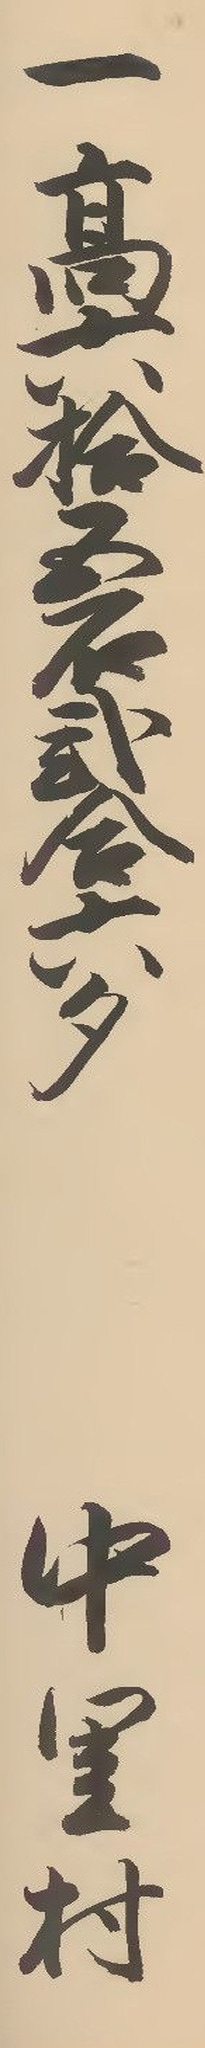一高六拾五石弐合六勺中里村
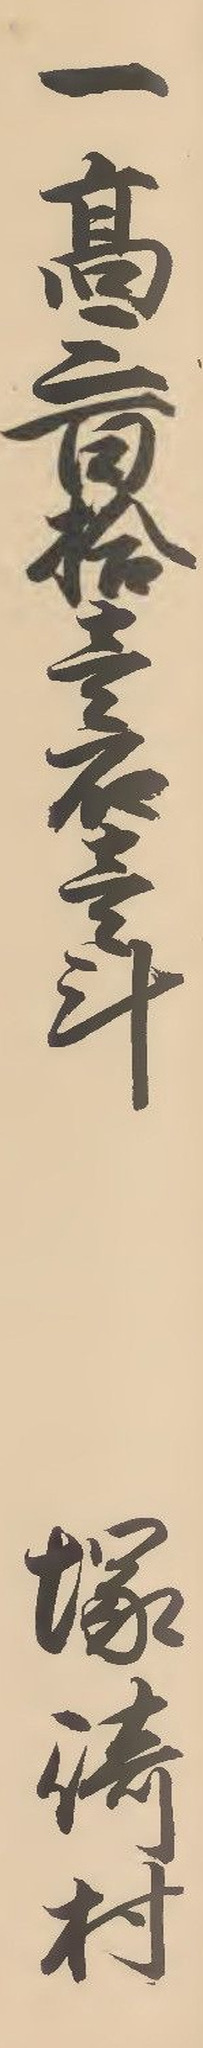一高三百拾壱石壱斗塚崎村
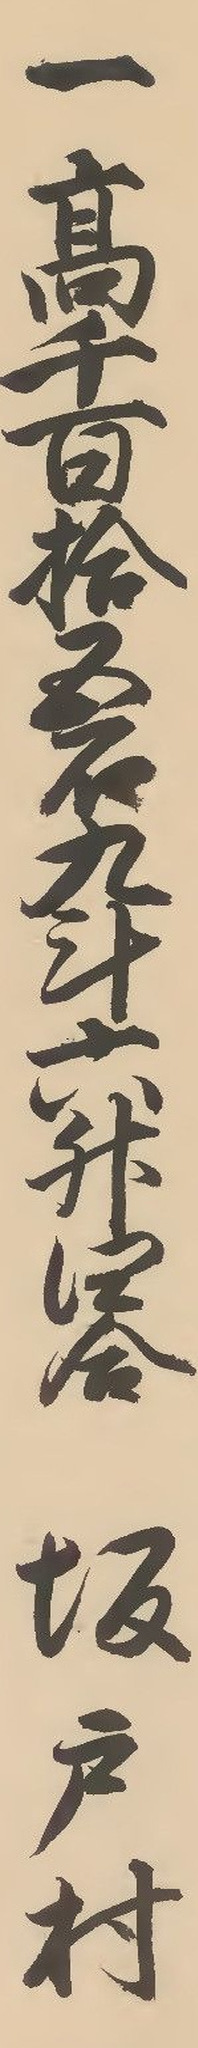一高千百拾五石九斗六升四合坂戸村
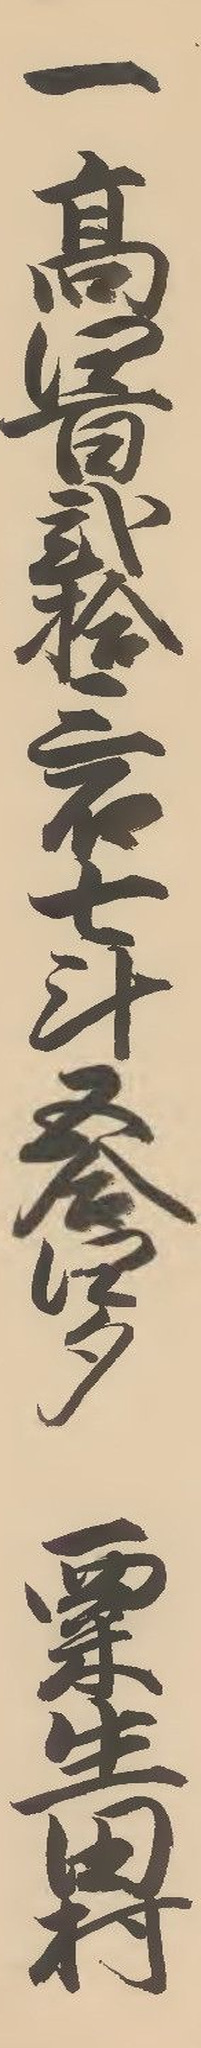一高四百弐拾三石七斗五合四勺粟生田村
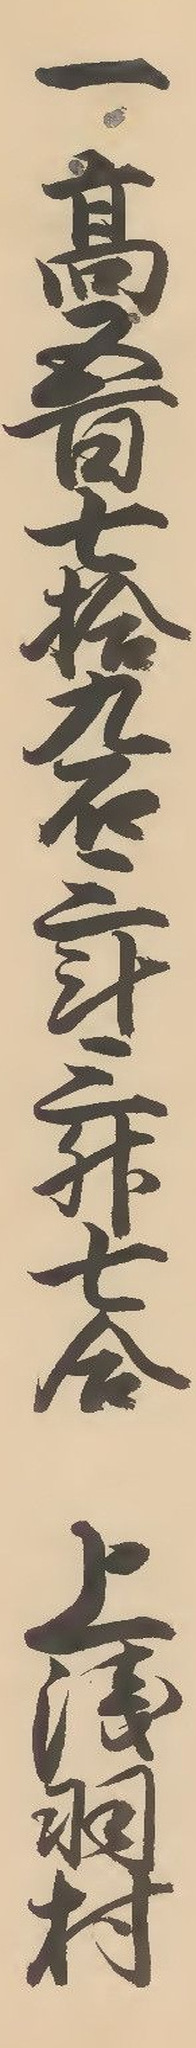一高五百七拾九石三斗三升七合上浅羽村

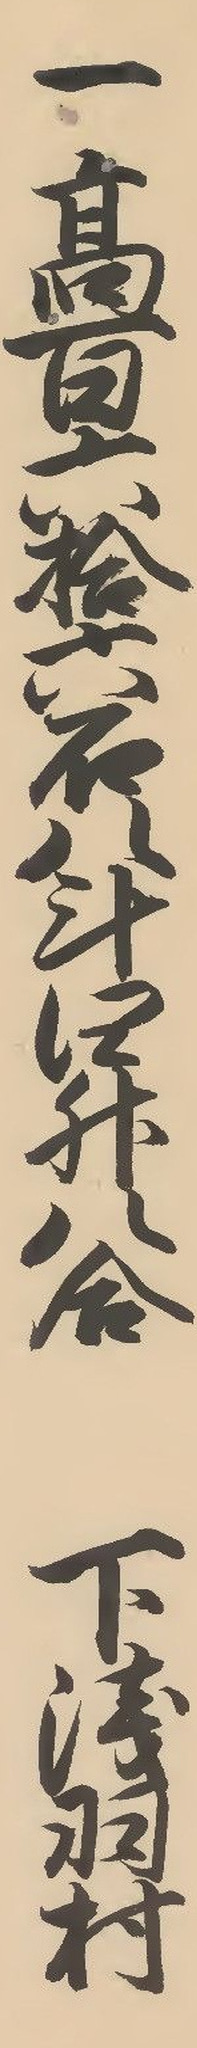一高百六拾六石八斗四升八合下浅羽村
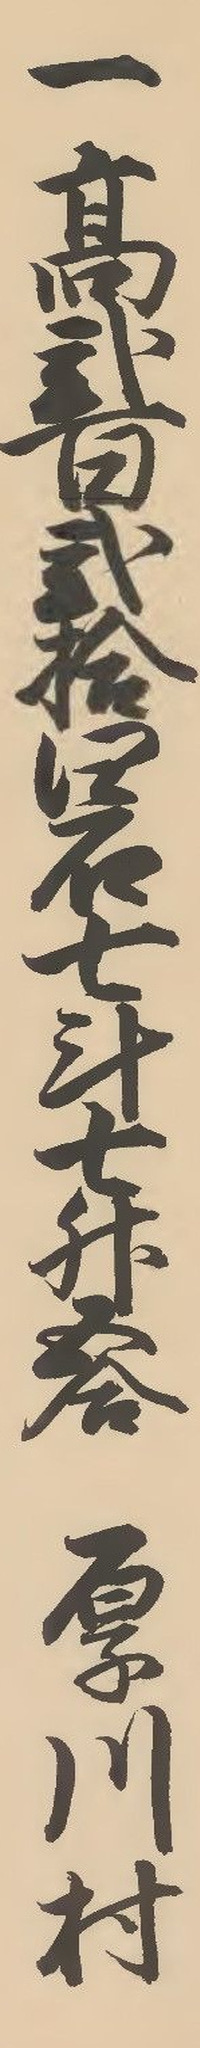一高弐百拾四石七斗七升五合厚川村
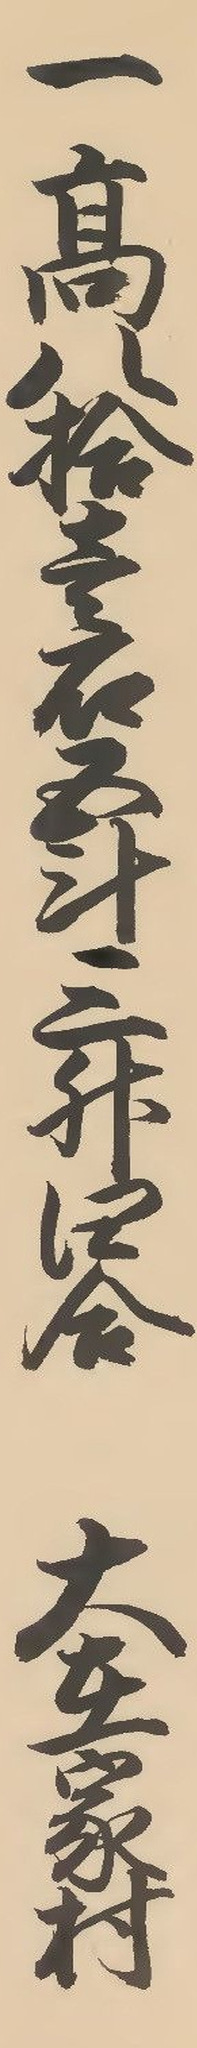一高八拾壱石五斗三升四合大在家村
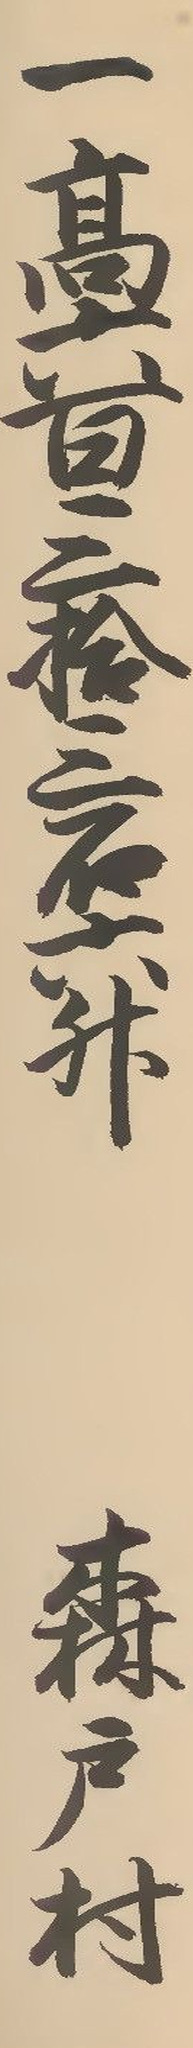一高六百三拾三石六升森戸村
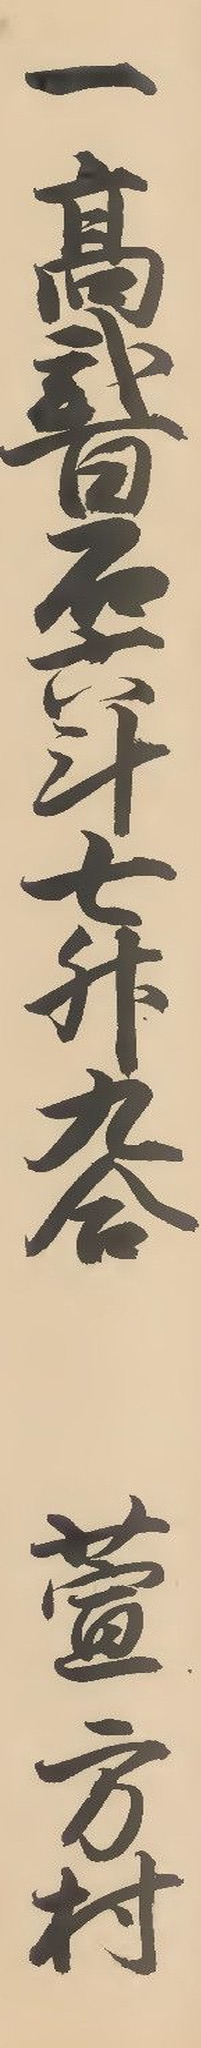一高弐百石六斗七升九合萱方村
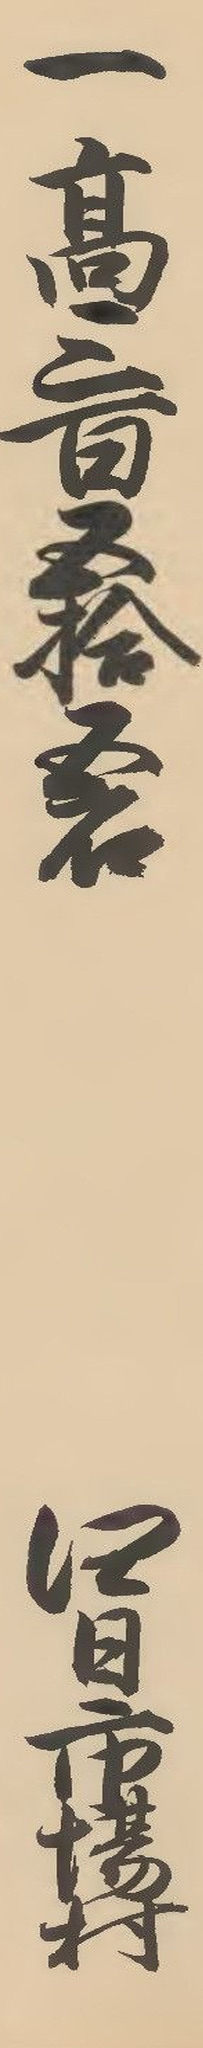一高三百五拾五石四日市場村
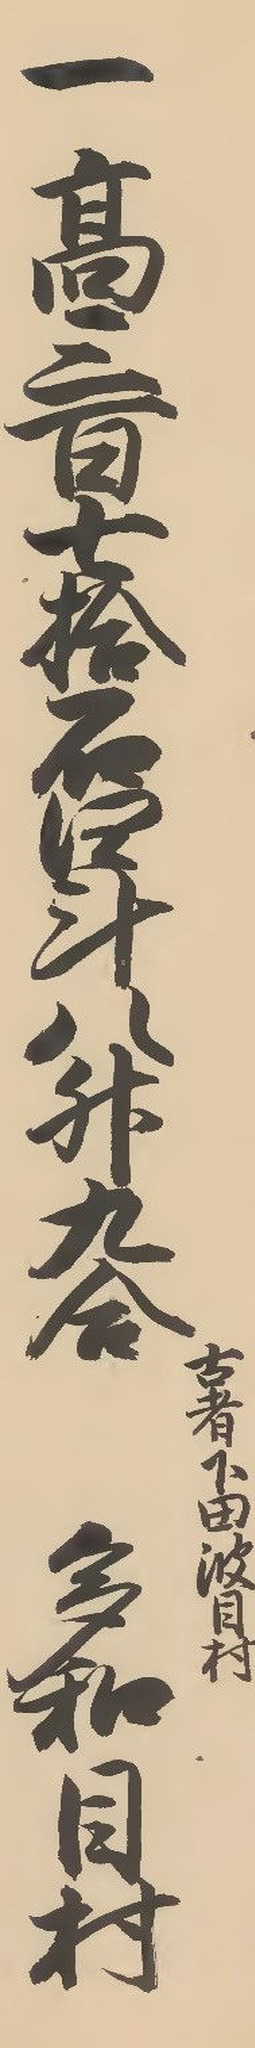一高三百七拾石四斗八升九合多和目村
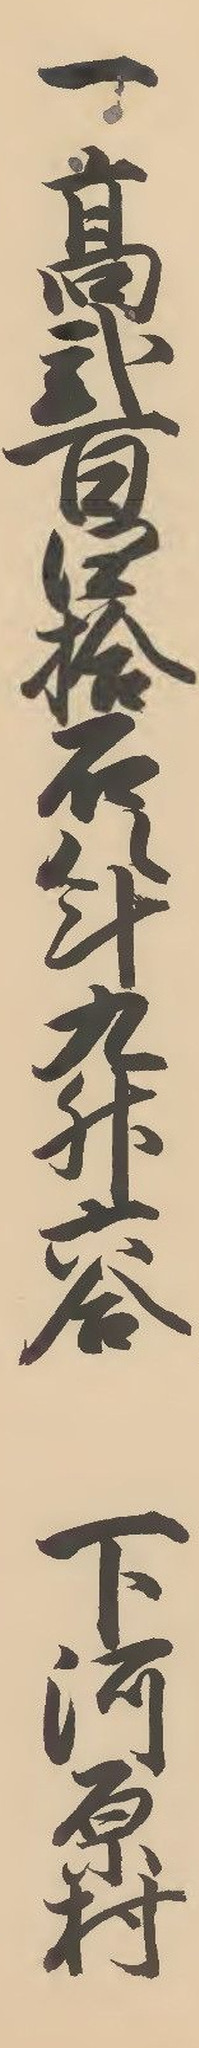一高弐百四拾石八斗九升六合下河原村

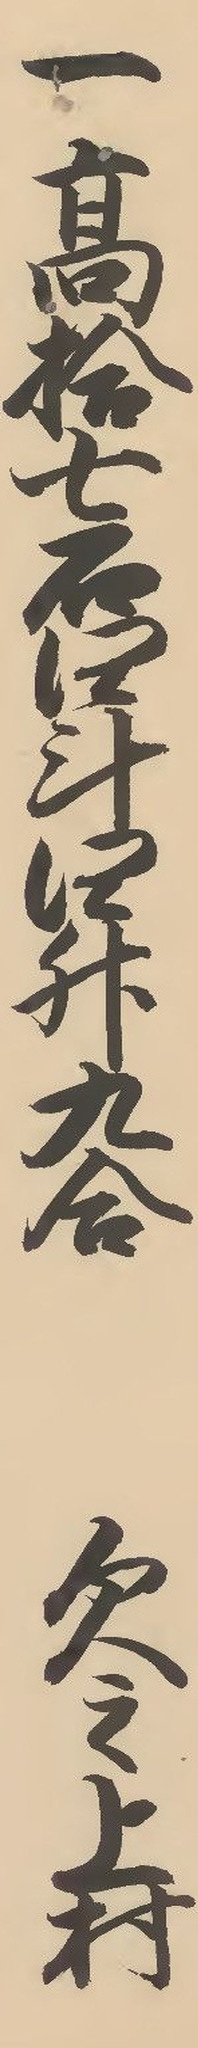一高拾七石四斗四升九合欠之上村
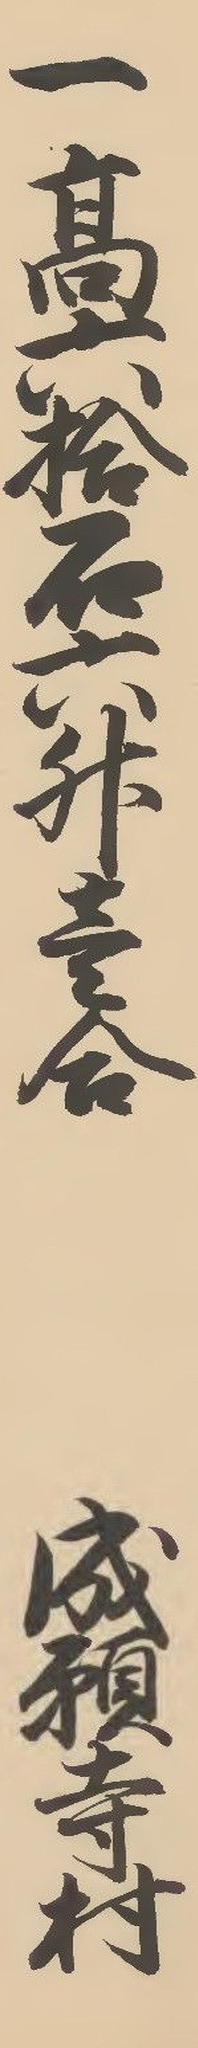一高六拾石六升壱合成願寺村
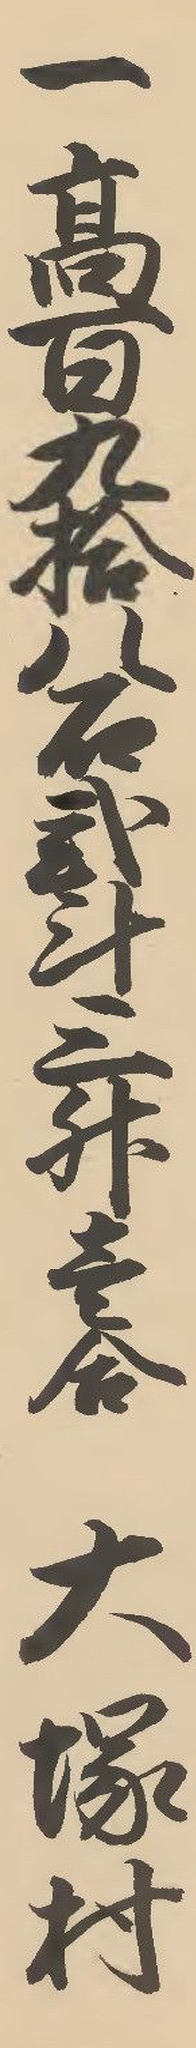一高百九拾八石弐斗三升壱合大塚村
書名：武蔵国郷帳　上
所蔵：国立公文書館 National Archives of Japan
